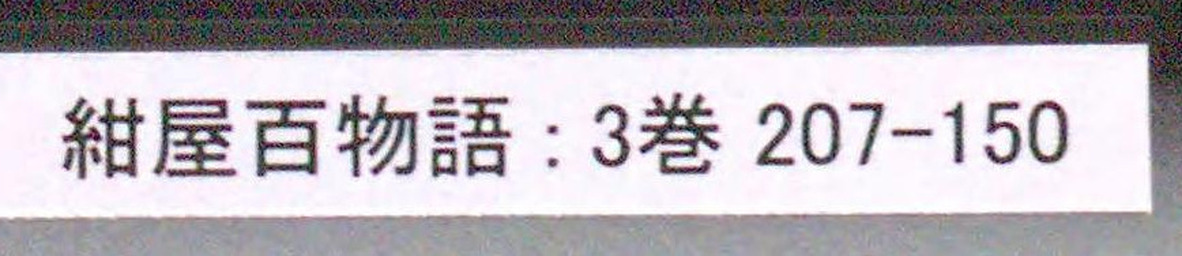紺屋百物語
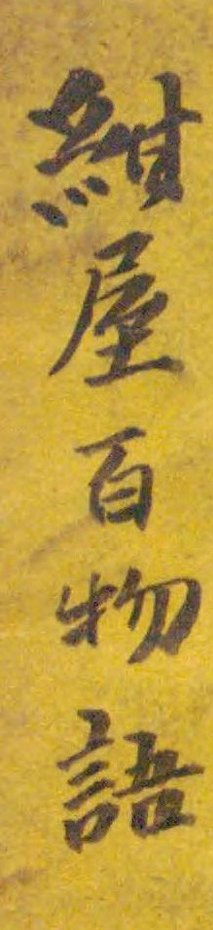紺屋百物語

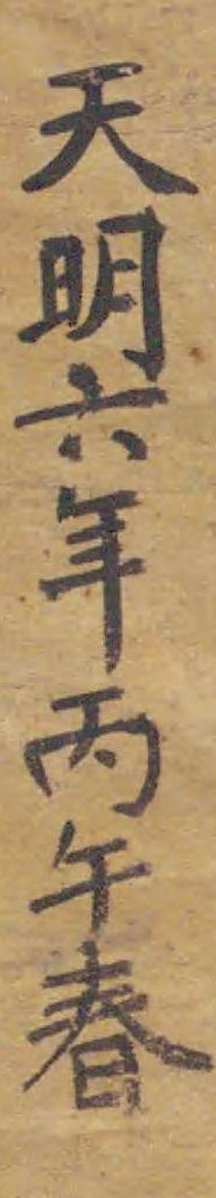天明六年丙午春

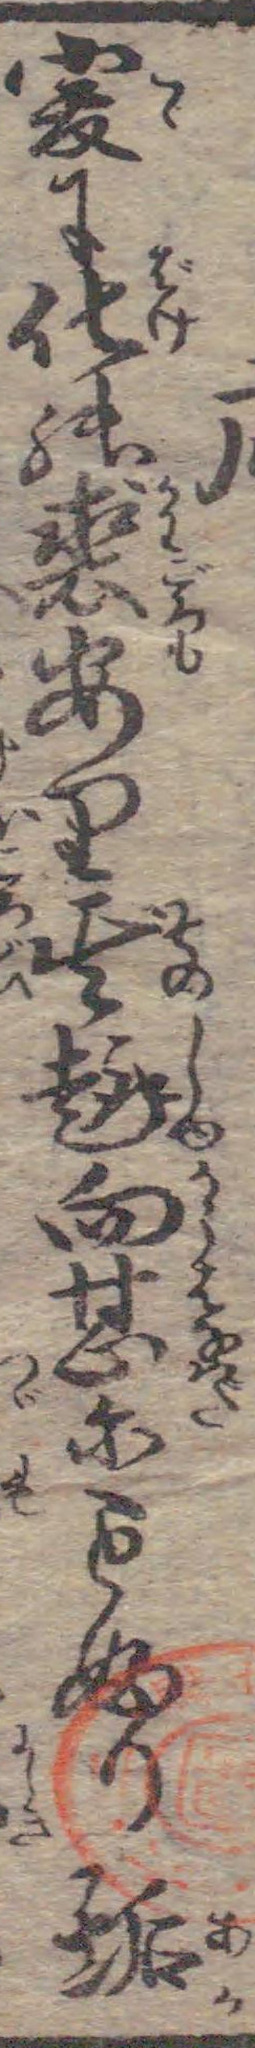爰に化の裘あり其趣向甚にことふり垢
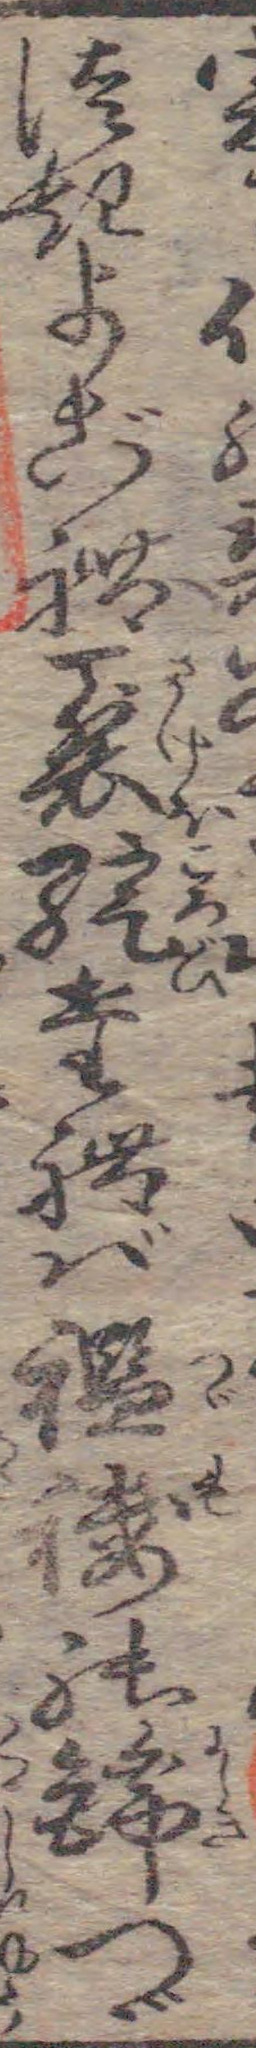つきよごれ裂綻たれば襤縷の錦つゞ
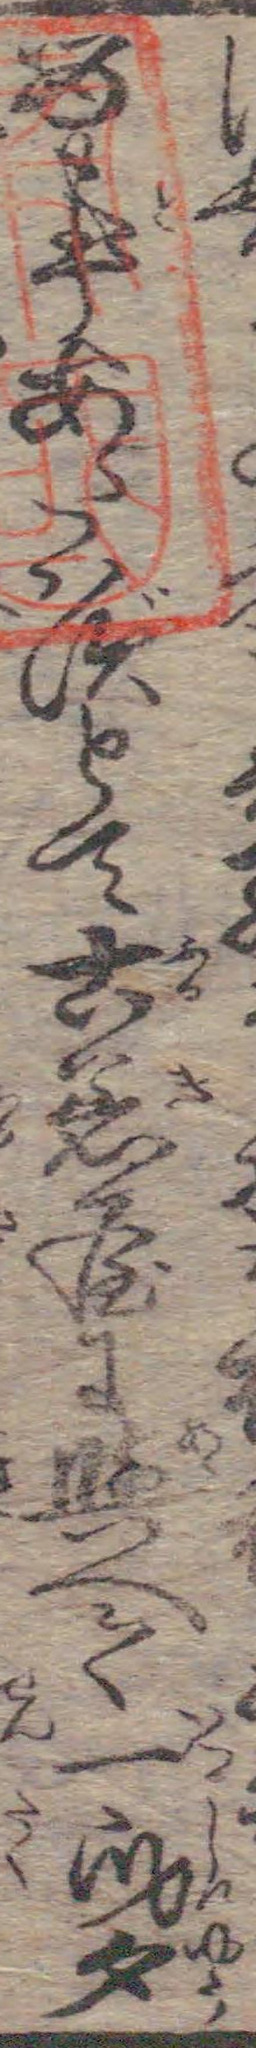る事あたはずとて古着屋に與へて一身夕
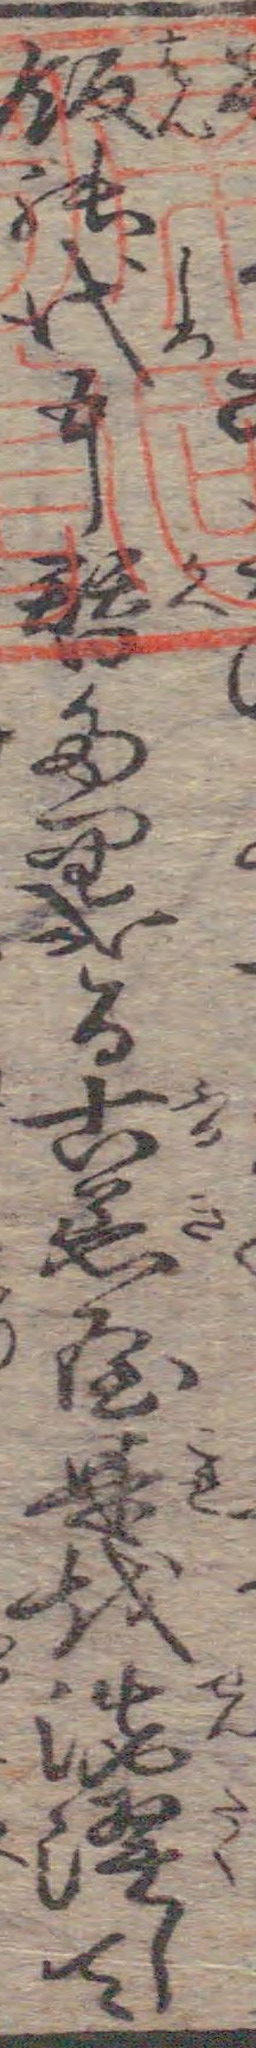飯の代に替たりける古着屋を洗濯して
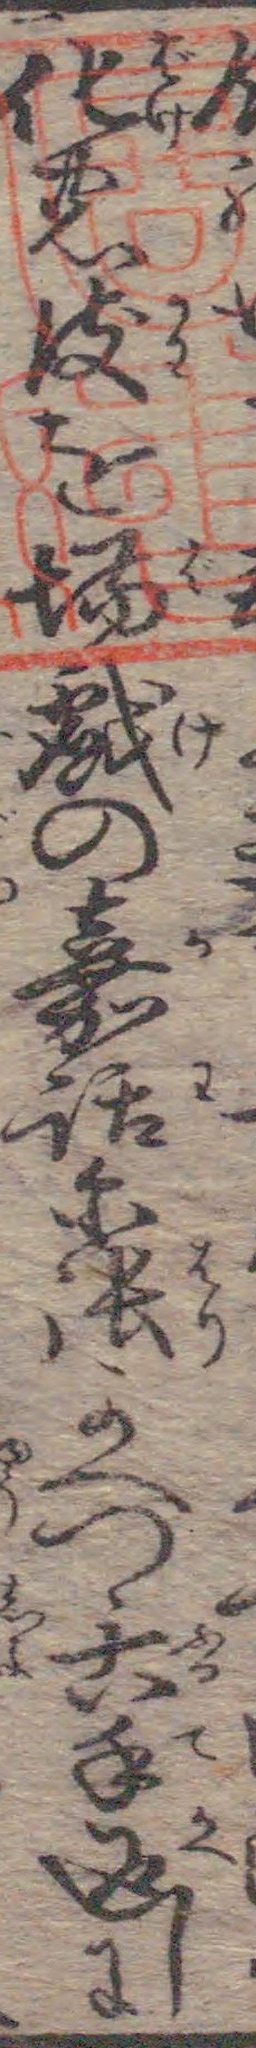化の皮を場戯の嘉話に張かへつゝ古手返しに
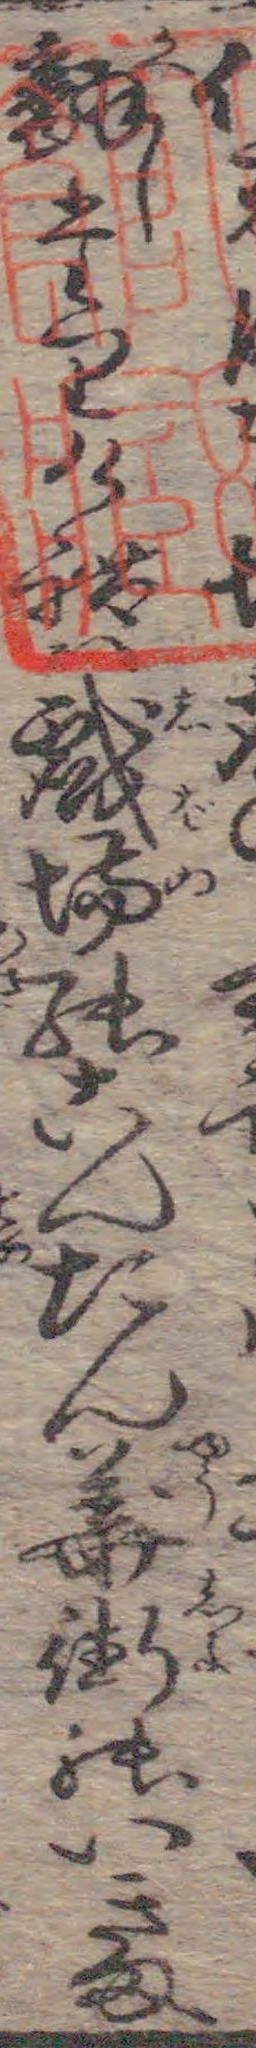翻したりけるは戯場のこんたん華街のいきま
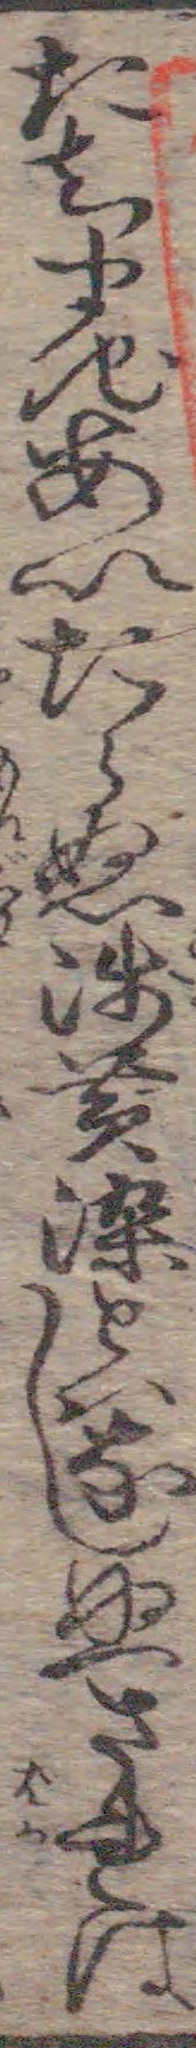たちまちあいたらぬ浅黄染とはなしぬされば
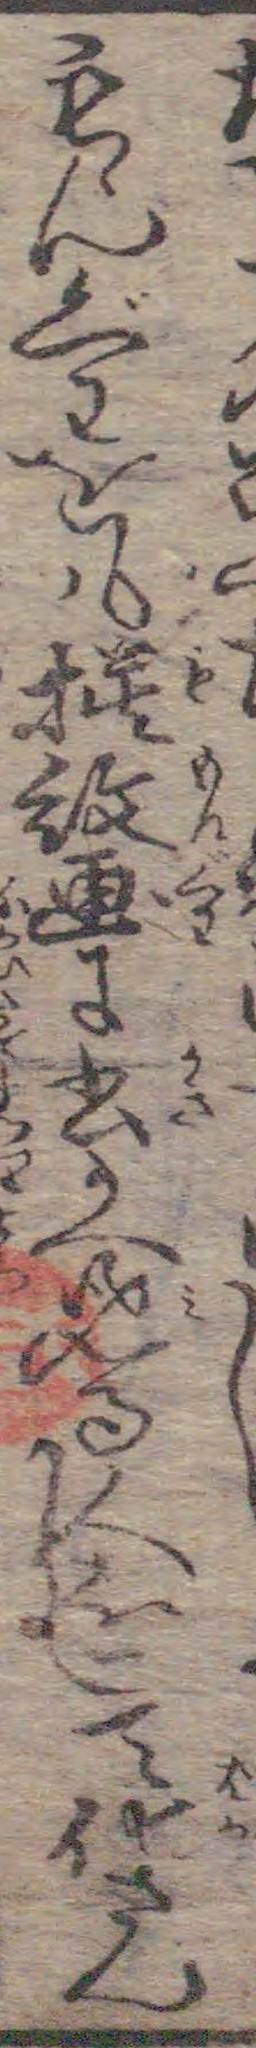もゝんぐわをも模紋画に書かへ見る人をして化さん
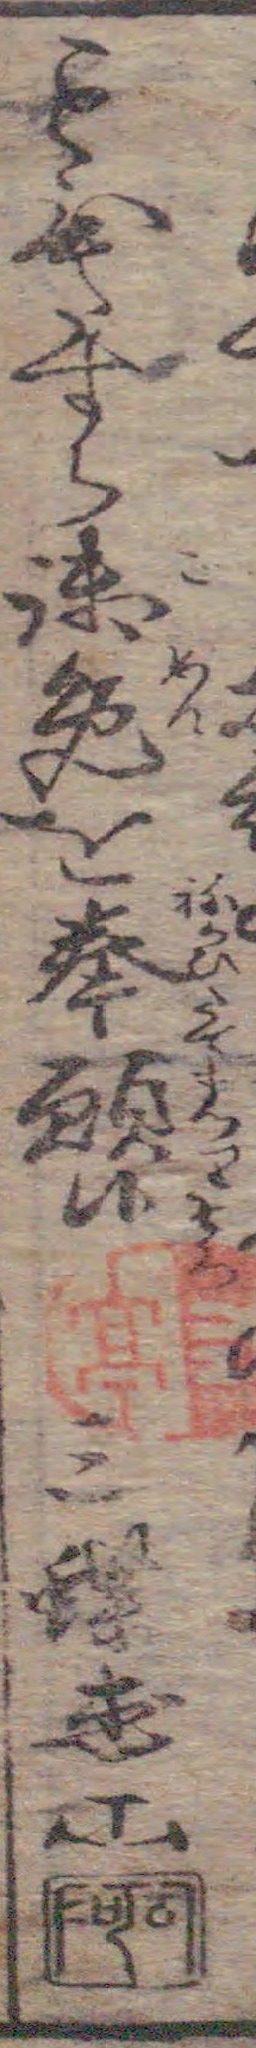ことひたすら御免を奉願候三蝶述

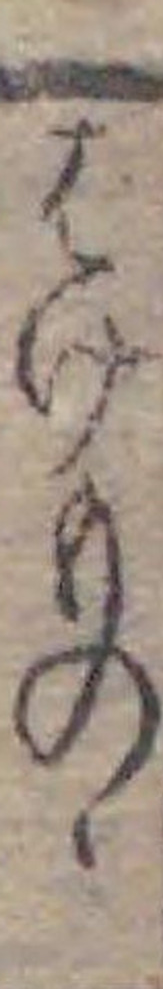はけものゝ
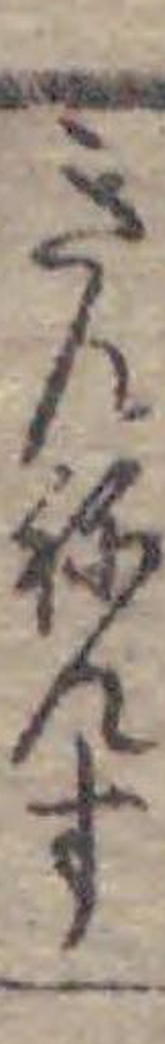きんねんす
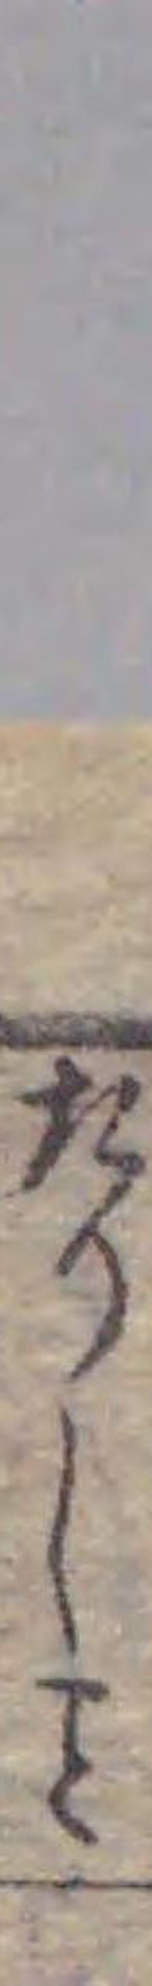たりしこと
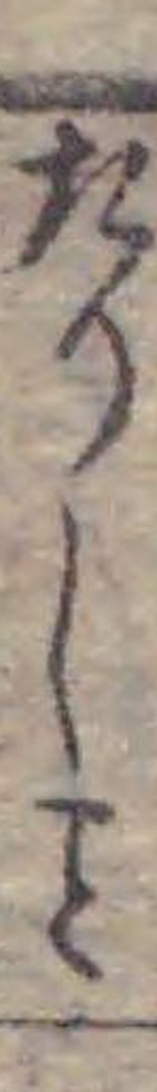たりしこと
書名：紺屋百物語 : 3巻
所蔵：国立国会図書館 National Diet Library, JAPAN
